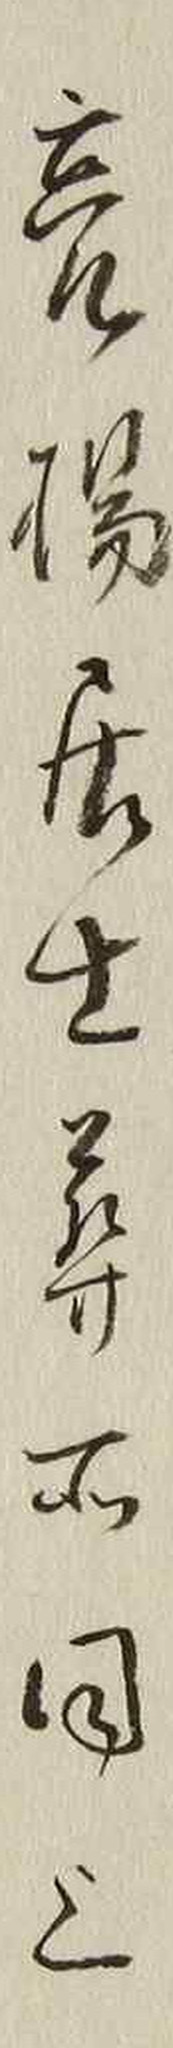充揚居士葬所同上
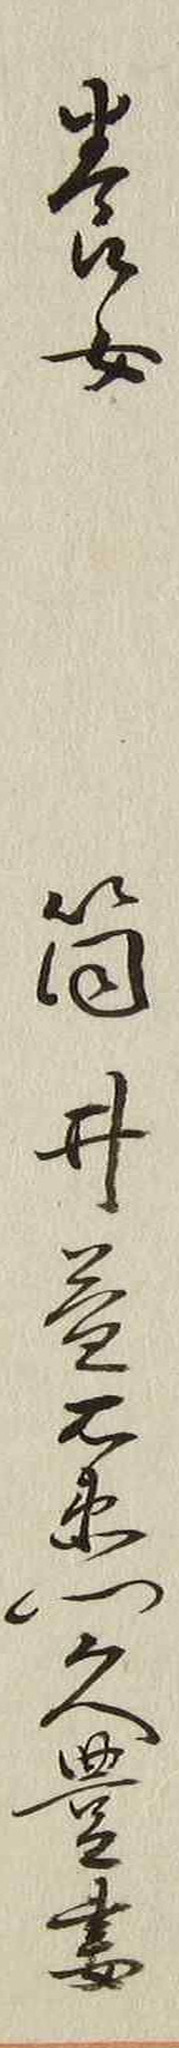養女筒井益右衛門久豊妻
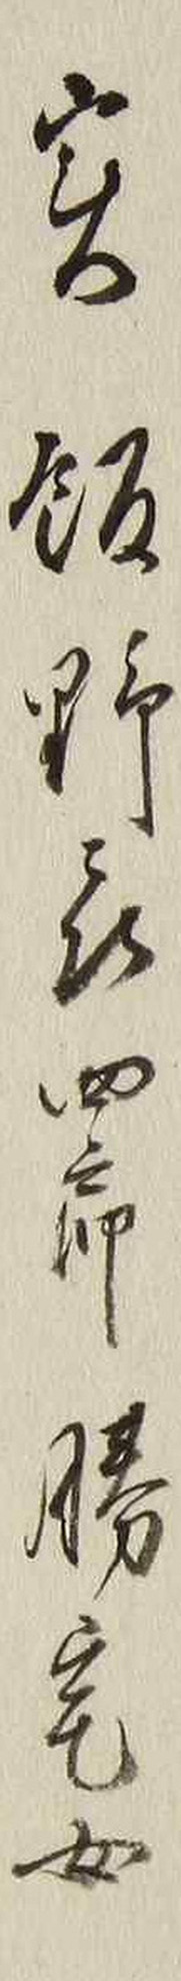実飯野喜四郎勝宅女
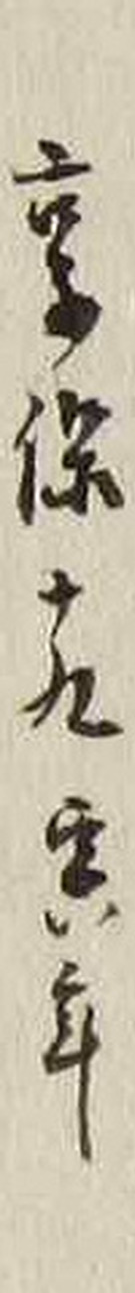享保十九寅年
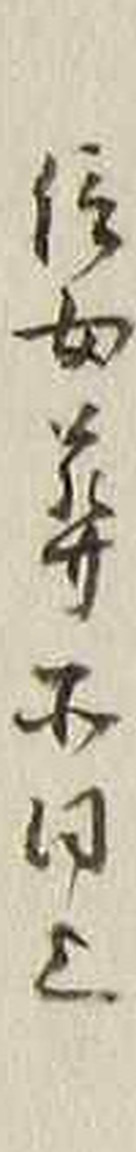信女葬所同上
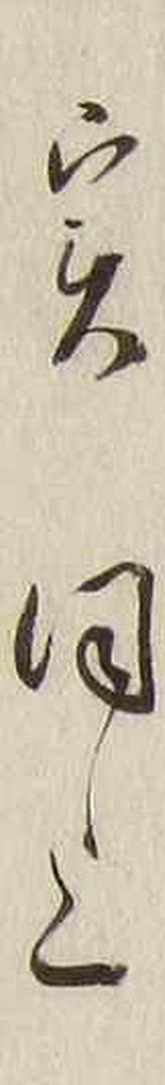実同上

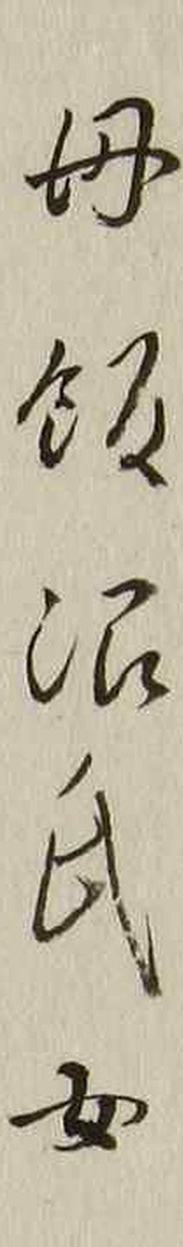母飯沼氏女
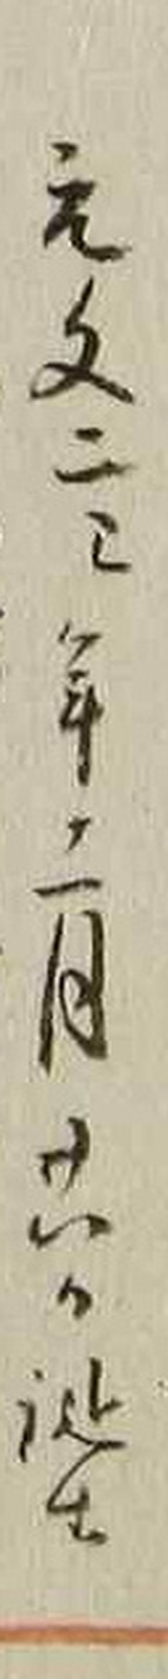元文二巳年十一月廿八日誕生
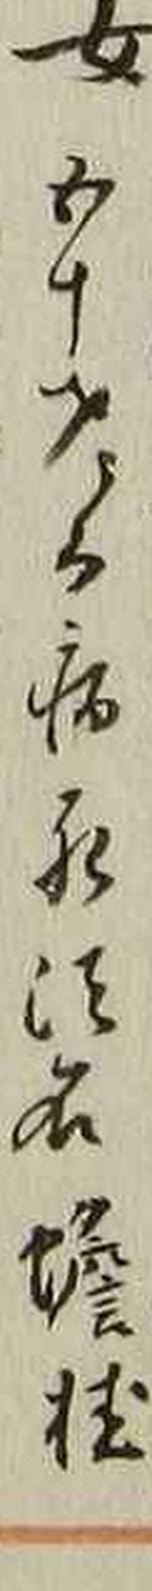五十才に而病死法名檐桂
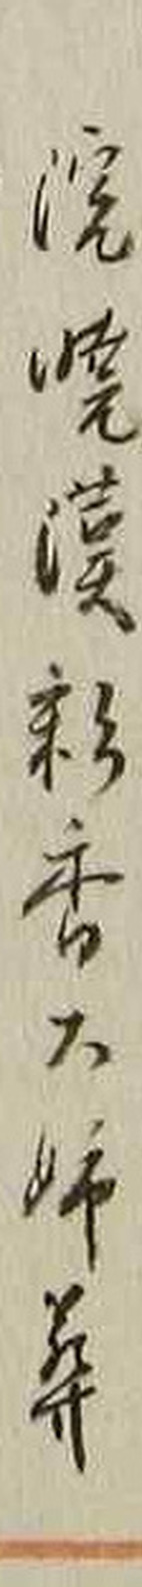院暁漠新香大姉葬所
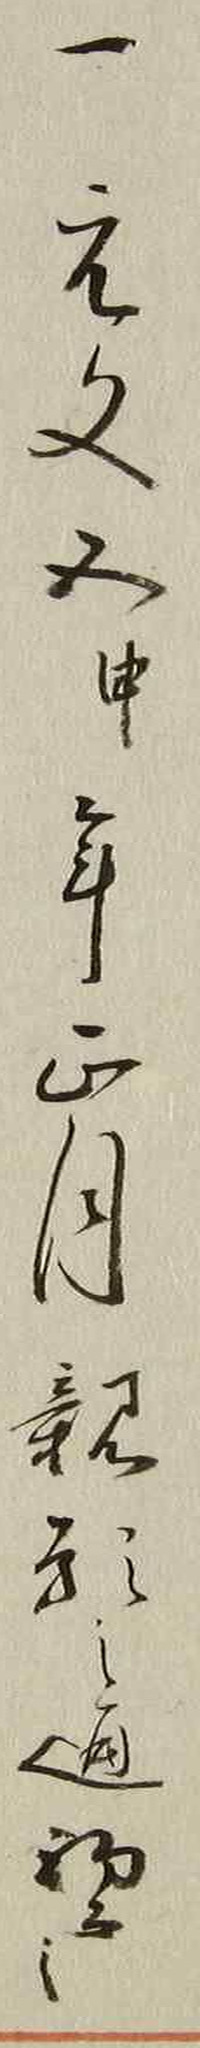一元文五申年正月親願之通初而之
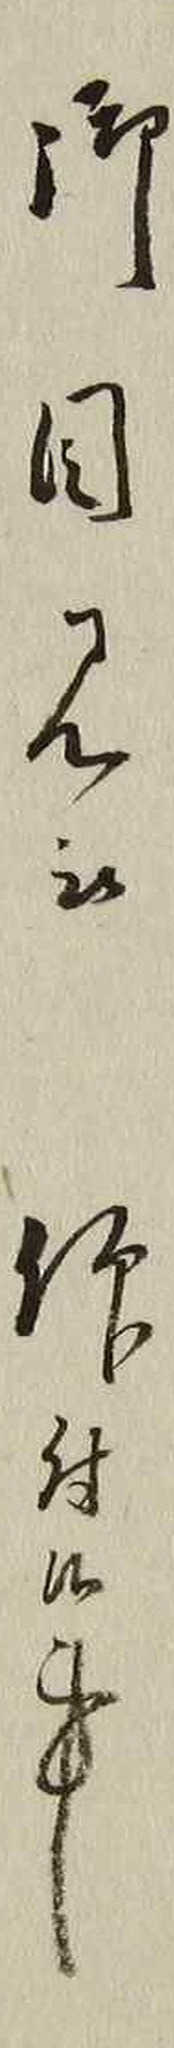御目見被仰付侯事
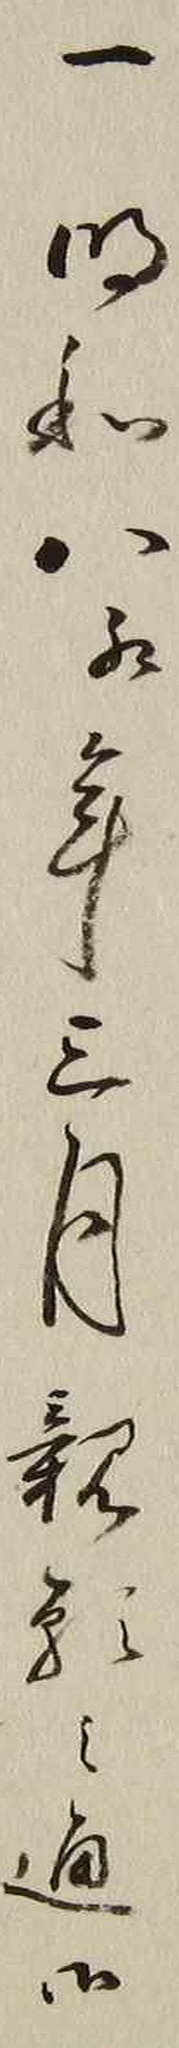一明和八卯年三月親願之通御
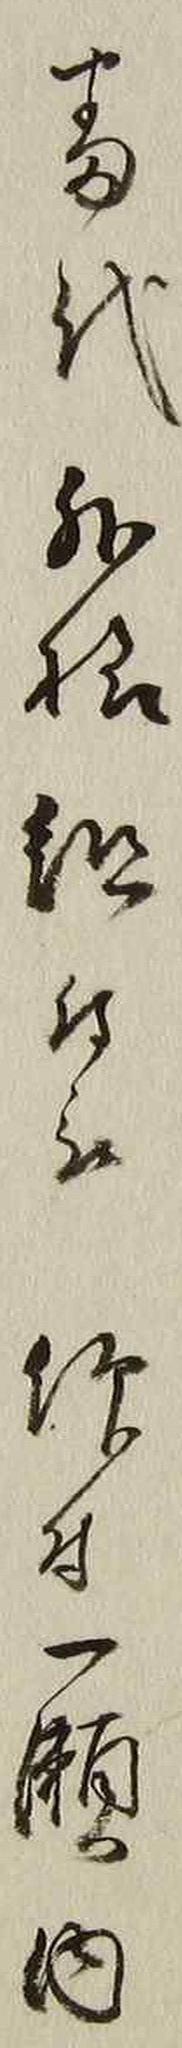番代外様組付被仰付一瀬内
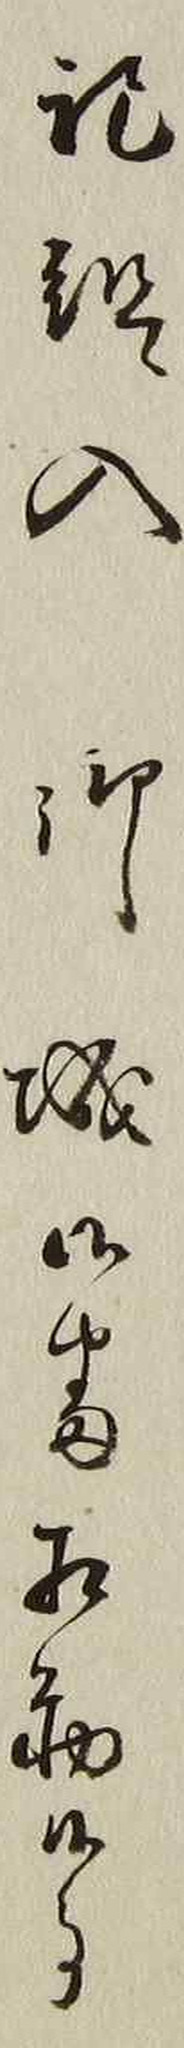記組へ入御城御番相勤候事
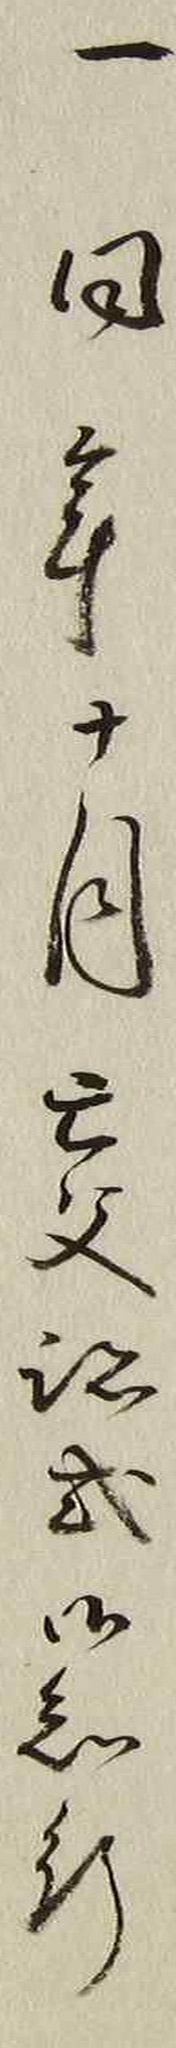一同年十月亡父跡式御知行
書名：諸士系譜　巻之159　な之部1
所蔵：会津若松市立会津図書館
